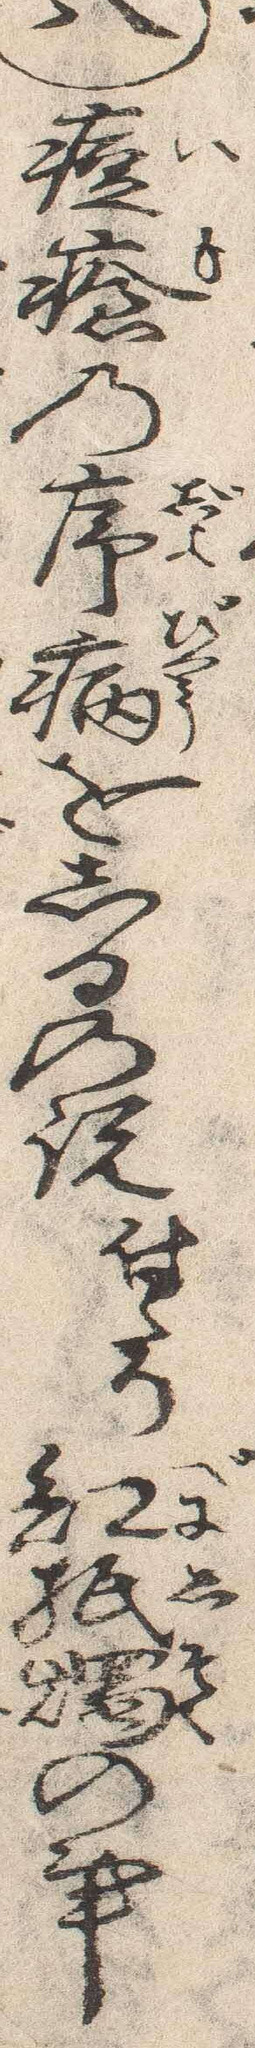㊇痘瘡の序病をしるの説付たり紅紙燭の事
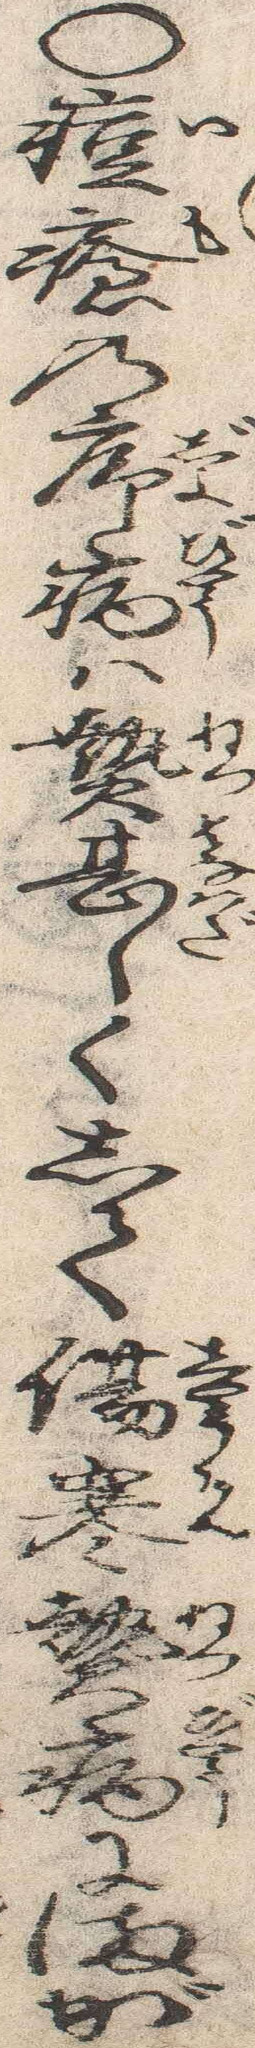○痘瘡の序病は熱甚しく傷寒熱病にまが
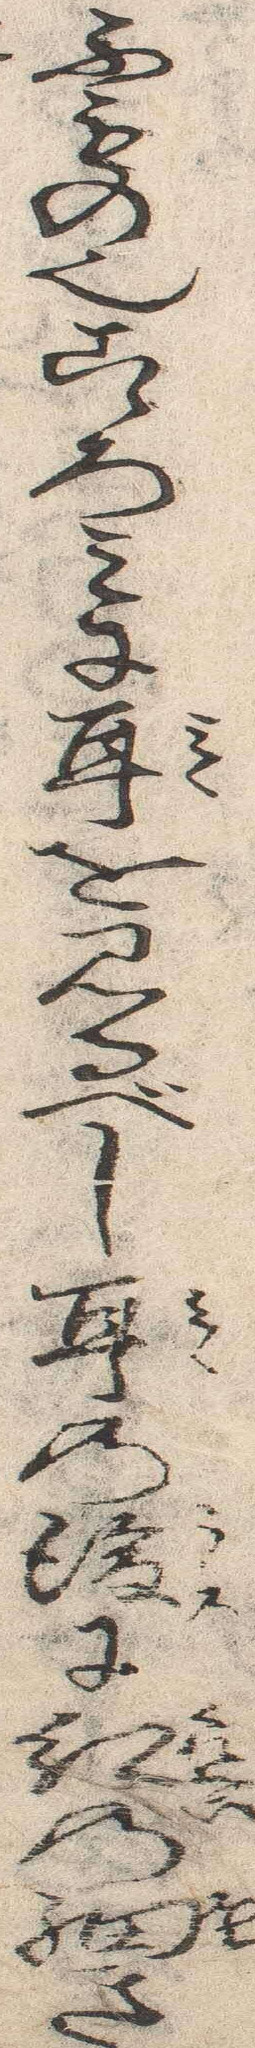ふもの也こゝろみに耳を見るべし耳のの後に紅の細き
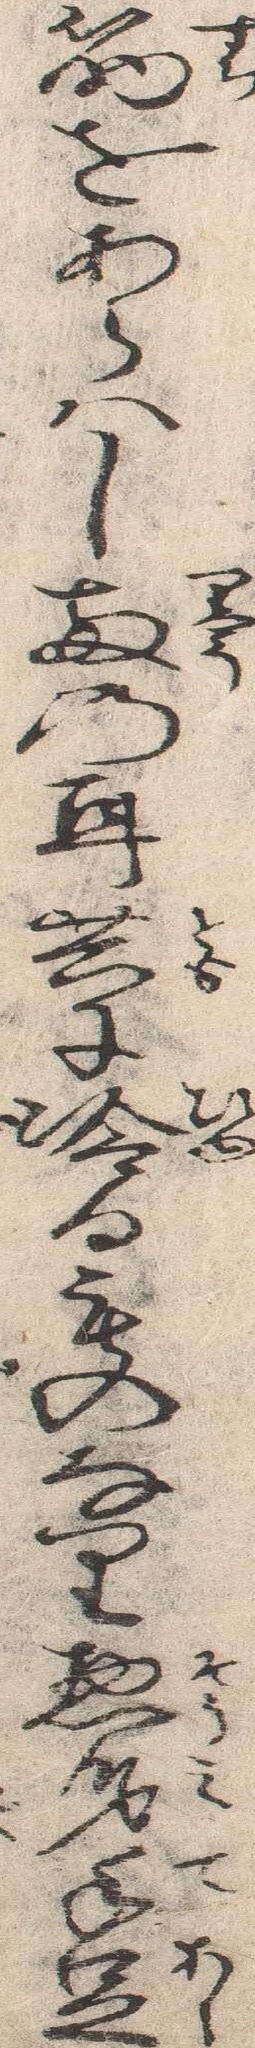筋をあらはし両の耳共に冷るものなり総身手足
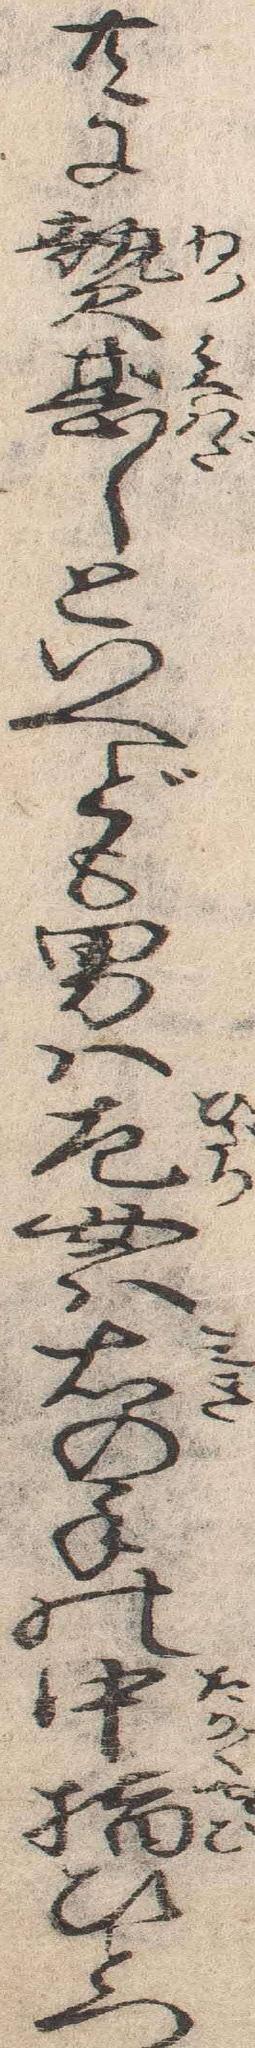共に熱甚しといへども男は左女は右の手の中指ひとつ

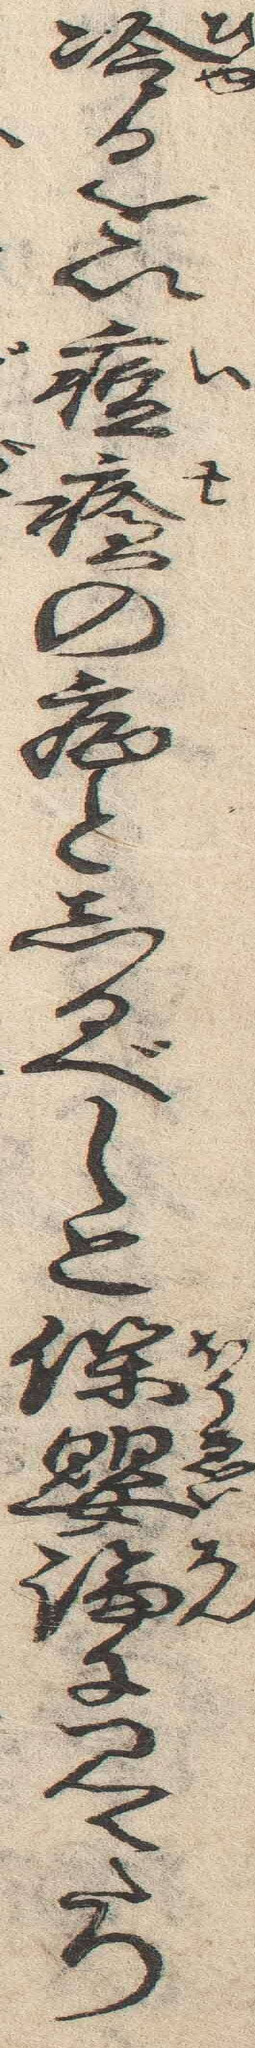冷るを以痘瘡の病としるべしと保嬰論に見えたり
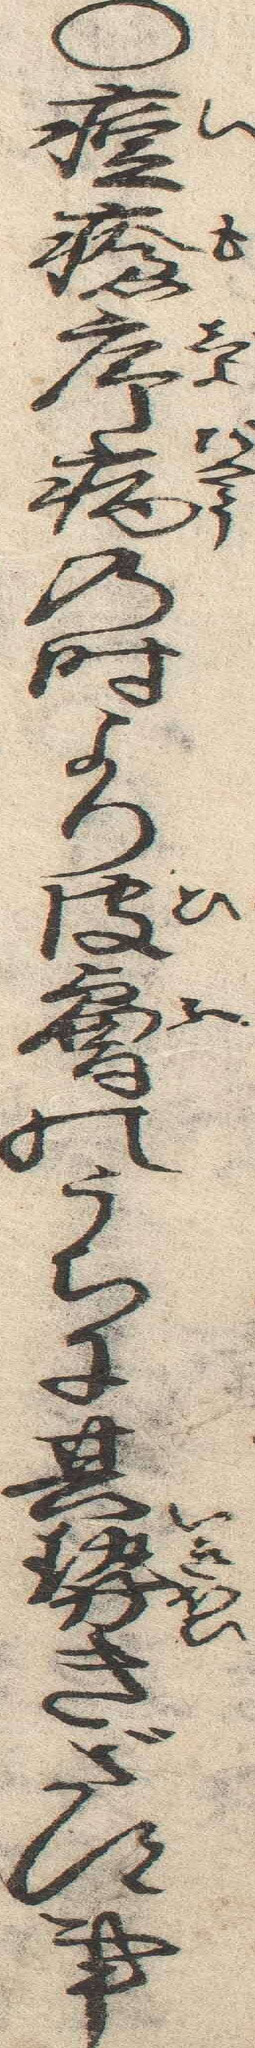○痘瘡序病の時より皮膚のうちに其勢きざす事
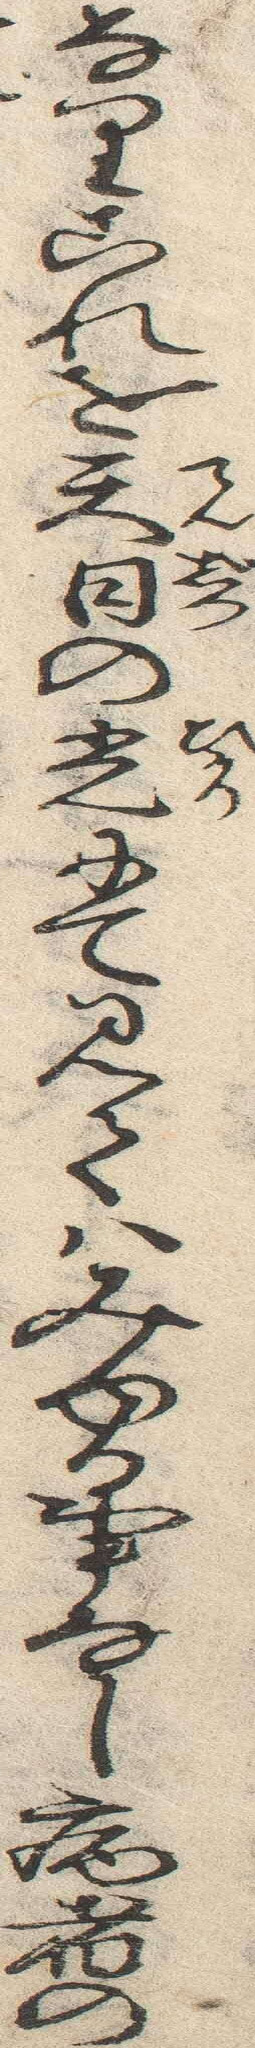なりこれを天日の光にて見てはみゆる事なし病者の
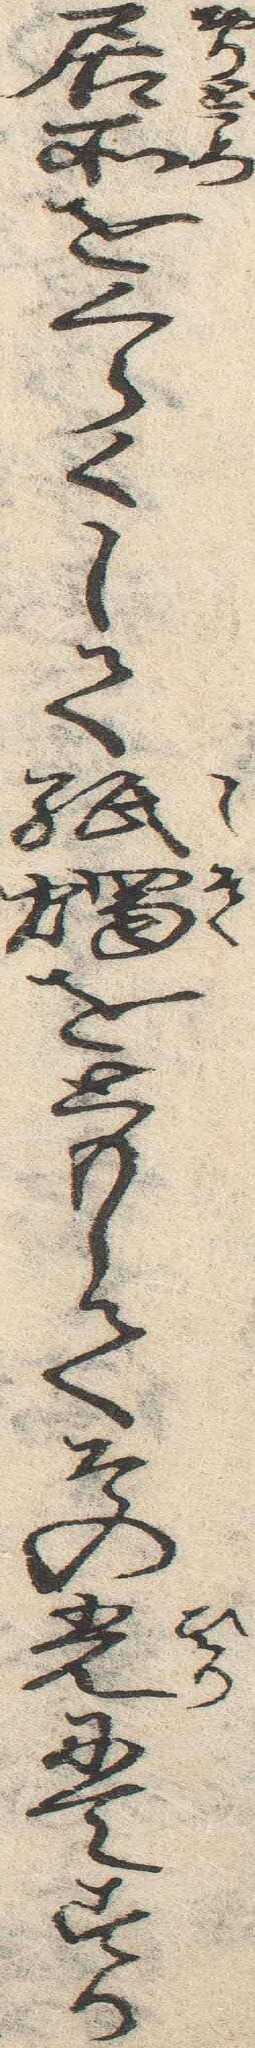居所をくらくして紙燭をともしてその光にてすか
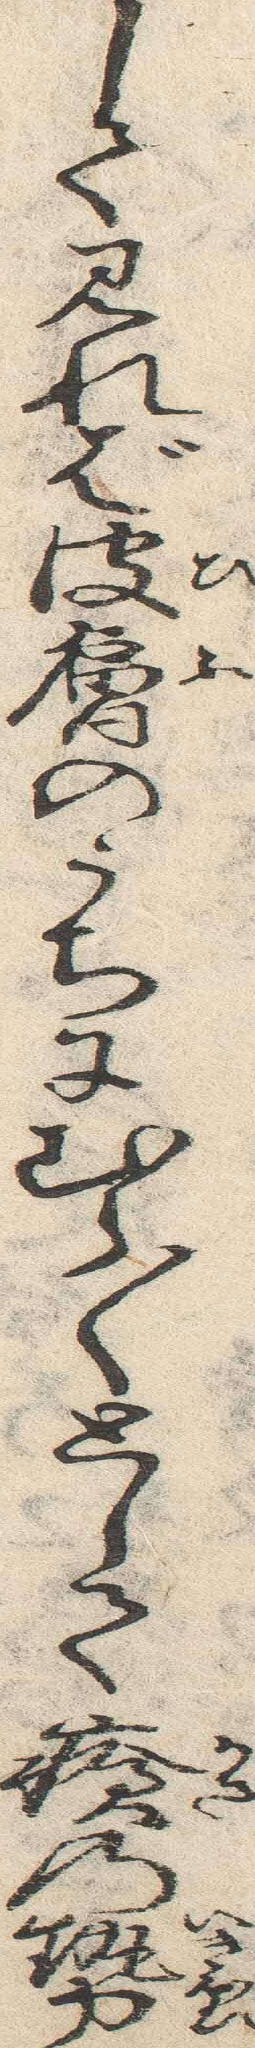して見れば皮膚のうちにむら〳〵として瘡の勢
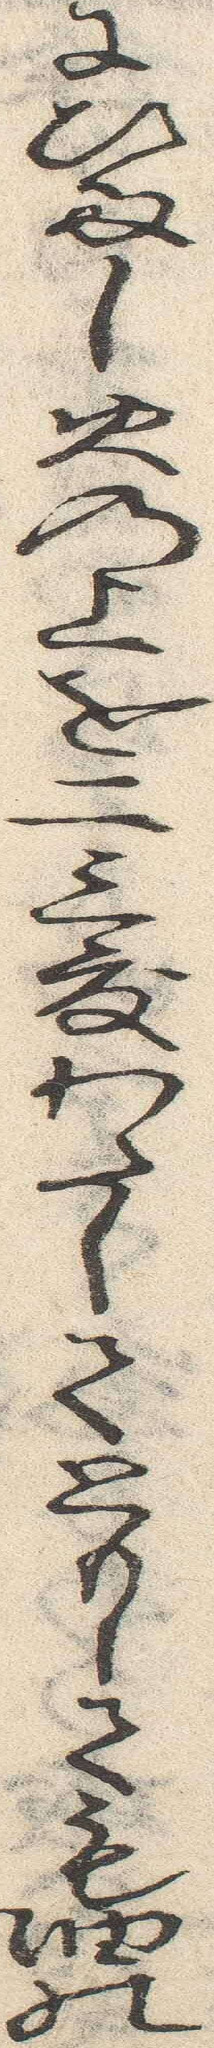にひたし火の上を二三度わたしてともしても油の
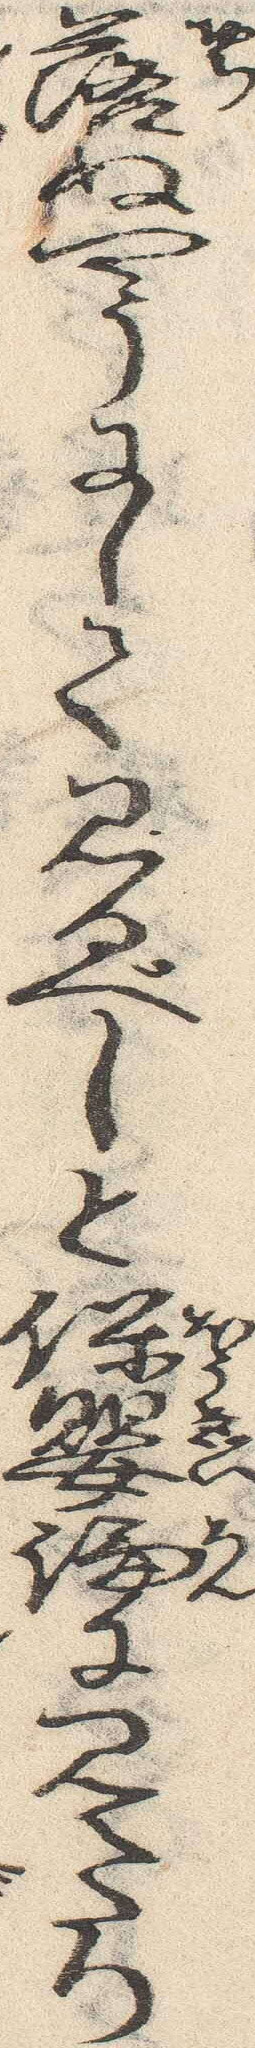落ぬやうにして見るべしと保嬰論に見えたり
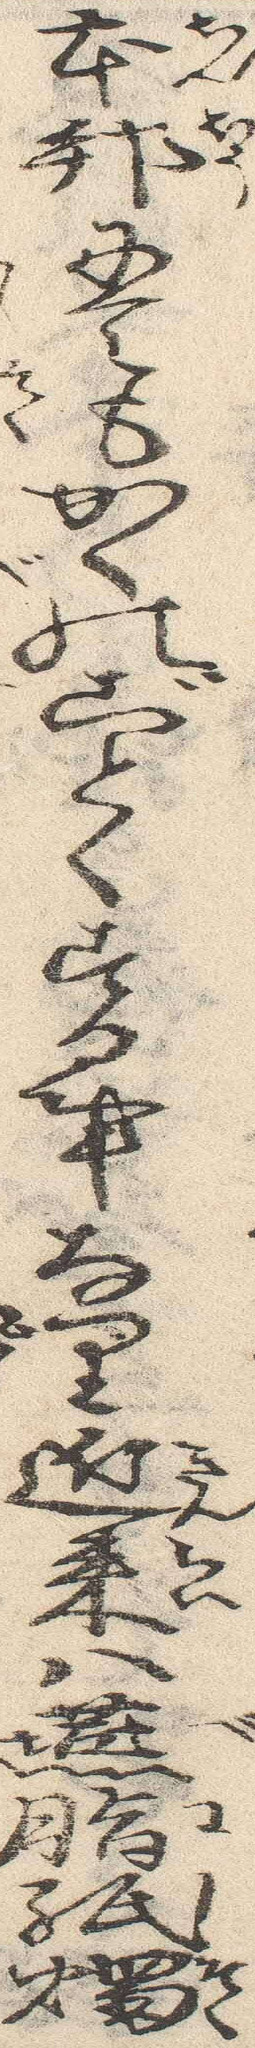本邦にてもかくのごとくする事なり近来は燕脂紙燭
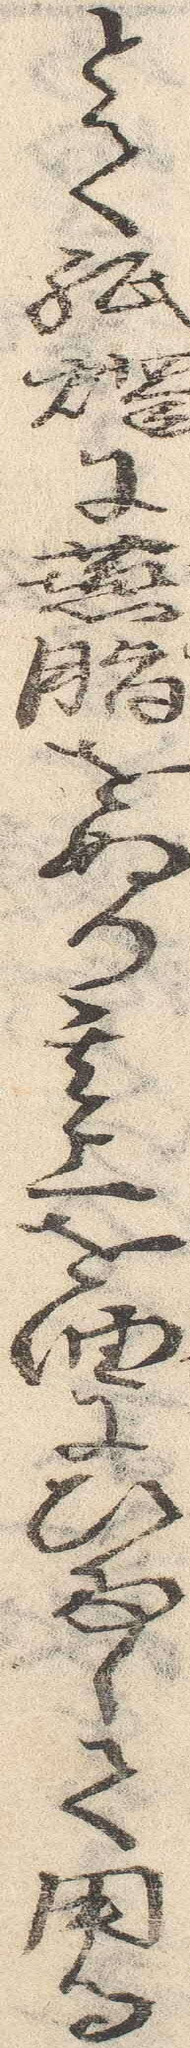とて紙燭に燕脂をぬり其上を油にひたして用る
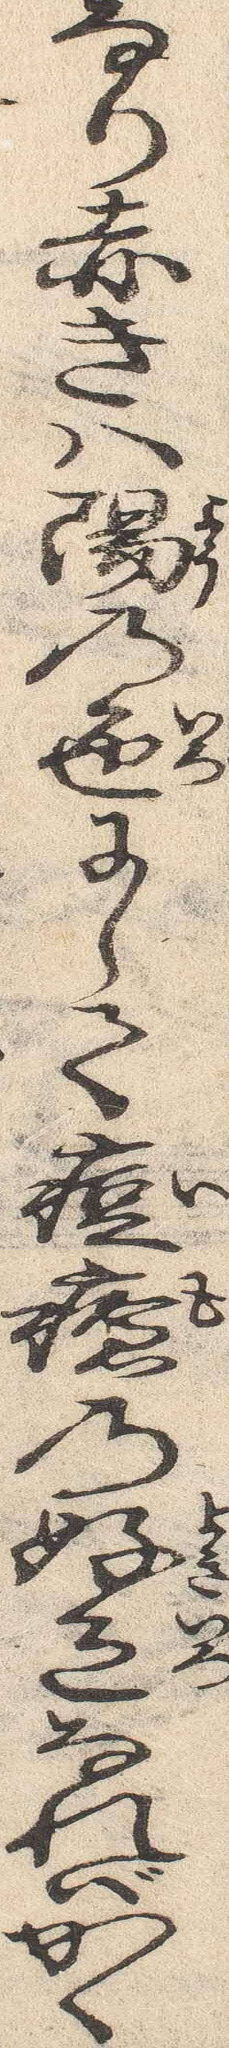なり赤きは陽の色にして痘瘡の好色なればかく
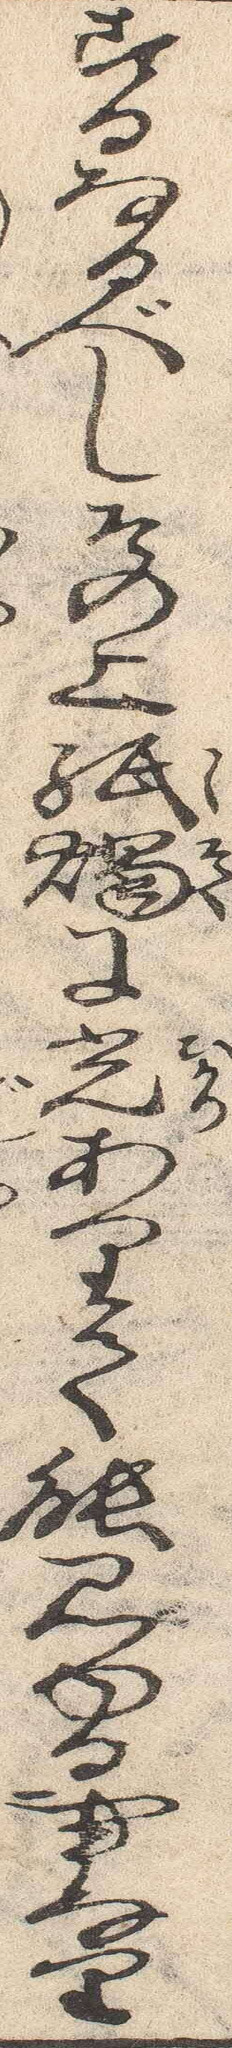するなるべしその上紙燭に光ありて能見ゆる事なり
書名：小児必用養育草
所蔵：東京学芸大学附属図書館 国文学研究資料館
